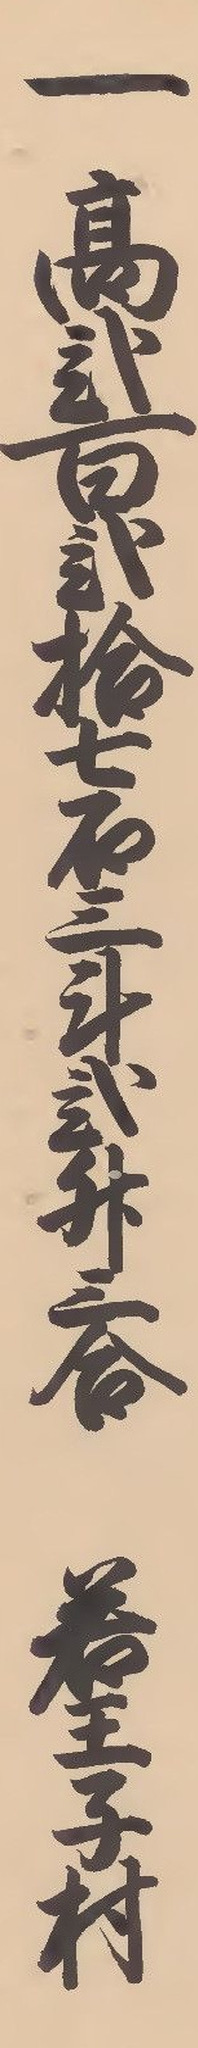一高弐百弐拾七石三斗弐升三合若王子村

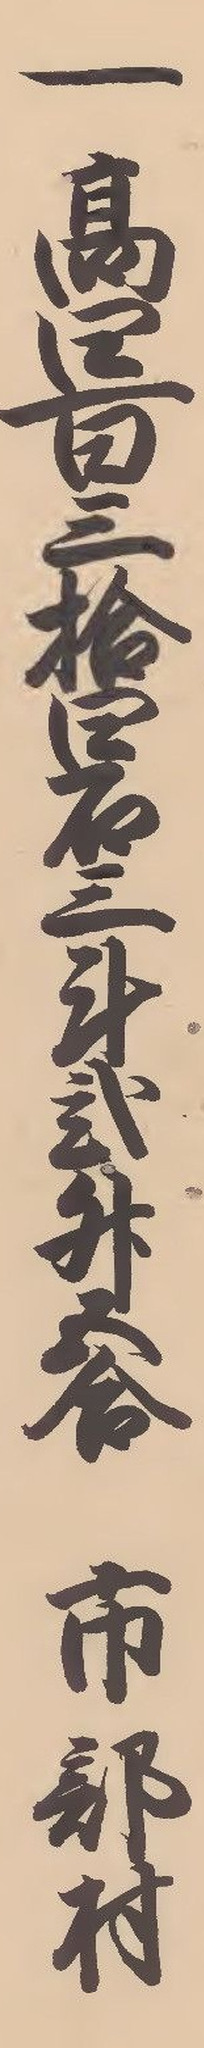一高四百三拾四石三斗弐升五合市部村
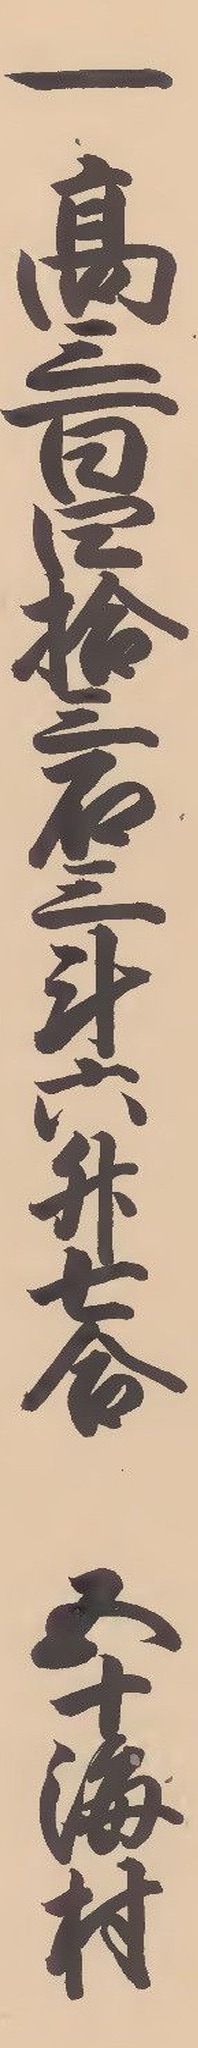一高三百四拾三石三斗六升七合五十海村
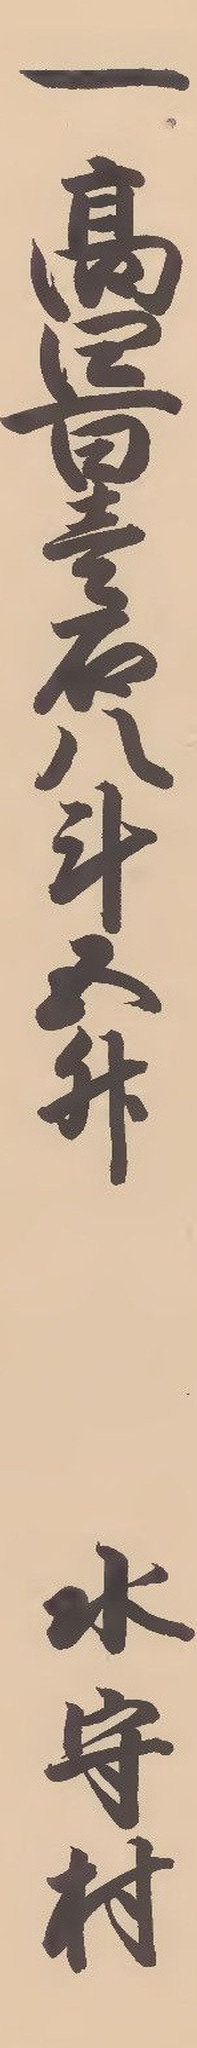一高四百壱石八斗五升水守村
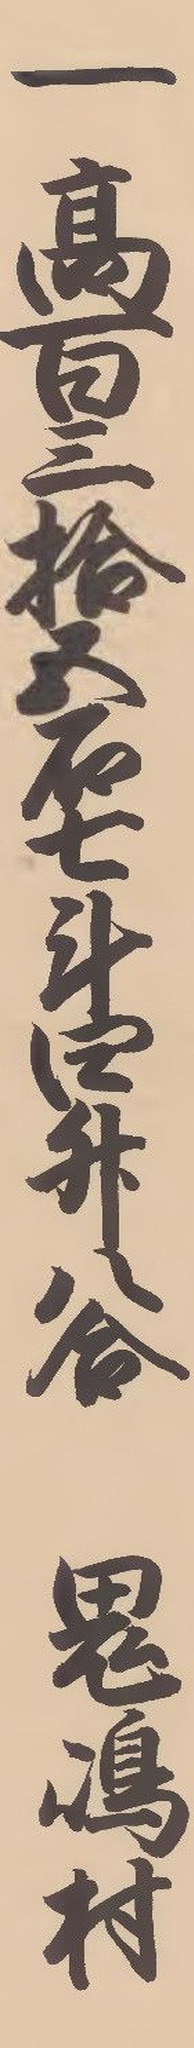一高百三拾五石七斗四升八合鬼島村
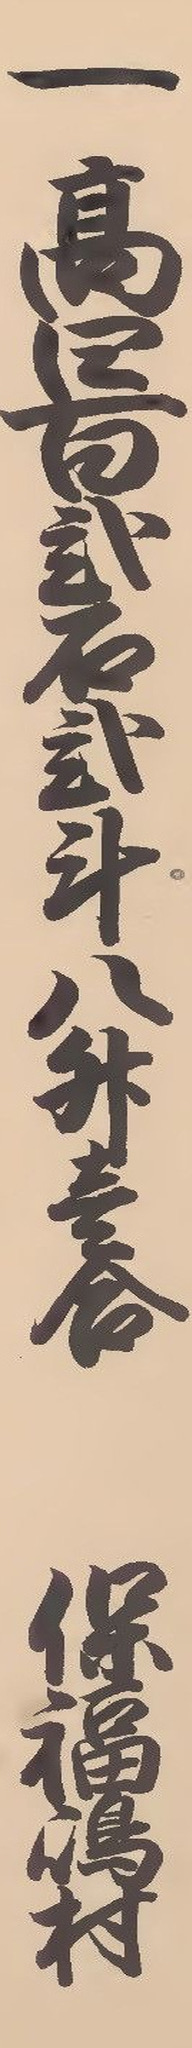一高四百弐石弐斗八升壱合保福島村
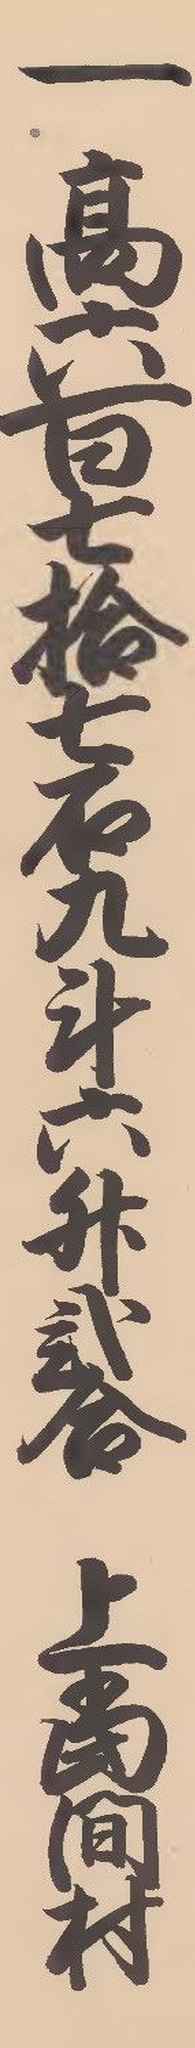一高六百七拾七石九斗六升弐合上当間村
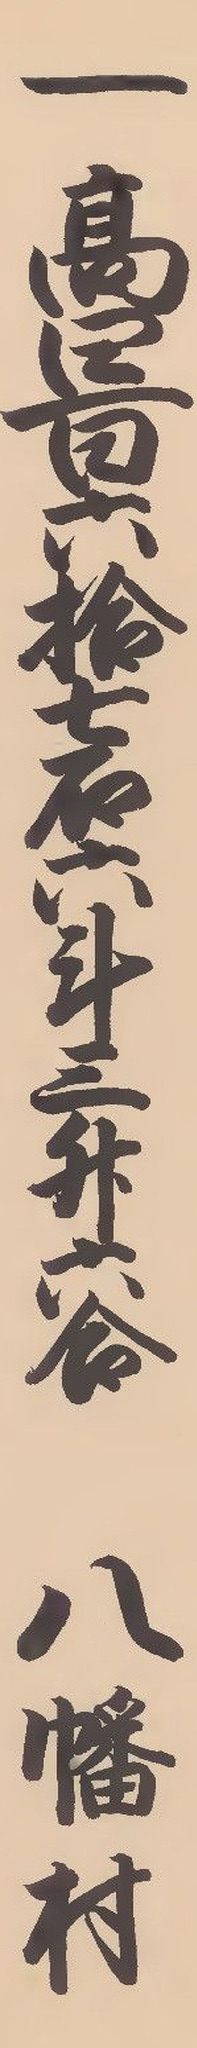一高四百六拾七石六斗三升六合八幡村
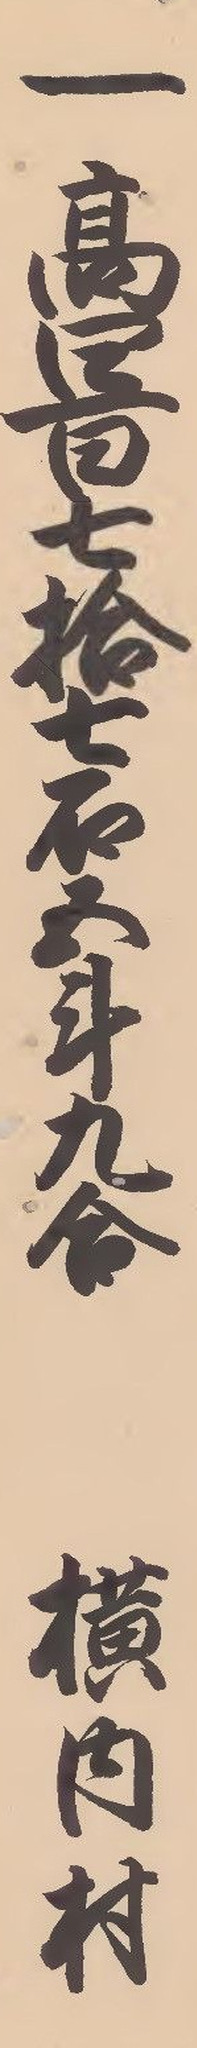一高四百七拾七石五斗九合横内村

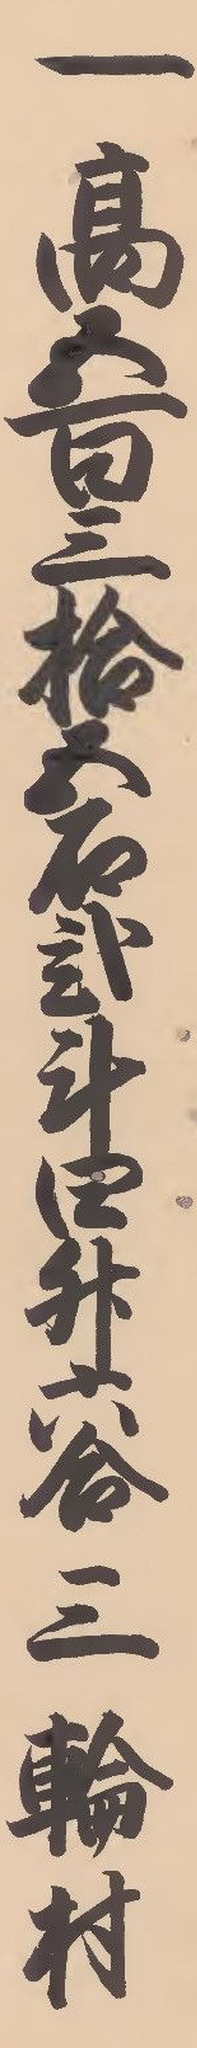一高五百三拾五石弐斗四升六合三輪村
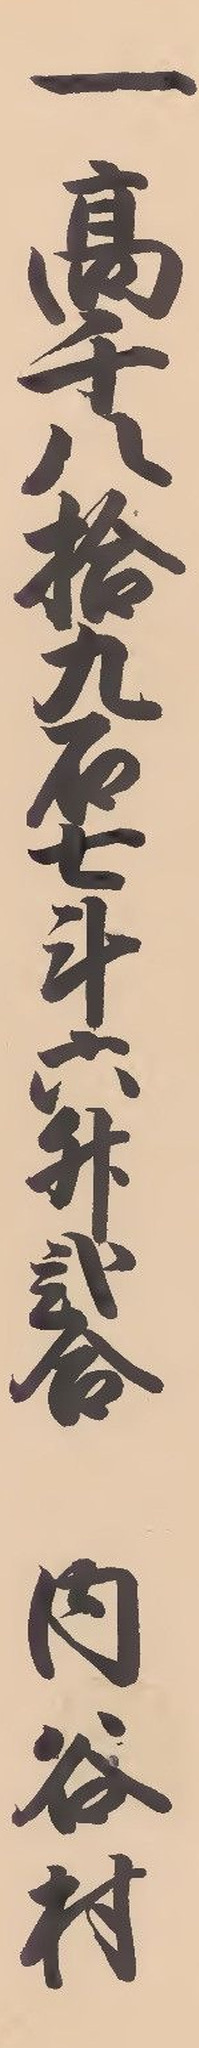一高千八拾九石七斗六升弐合内谷村
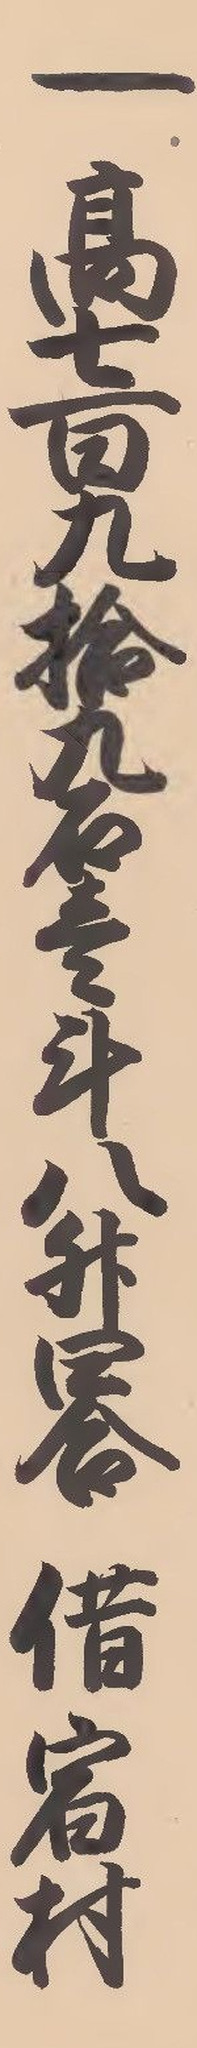一高七百九拾九石壱斗八升四合借宿村
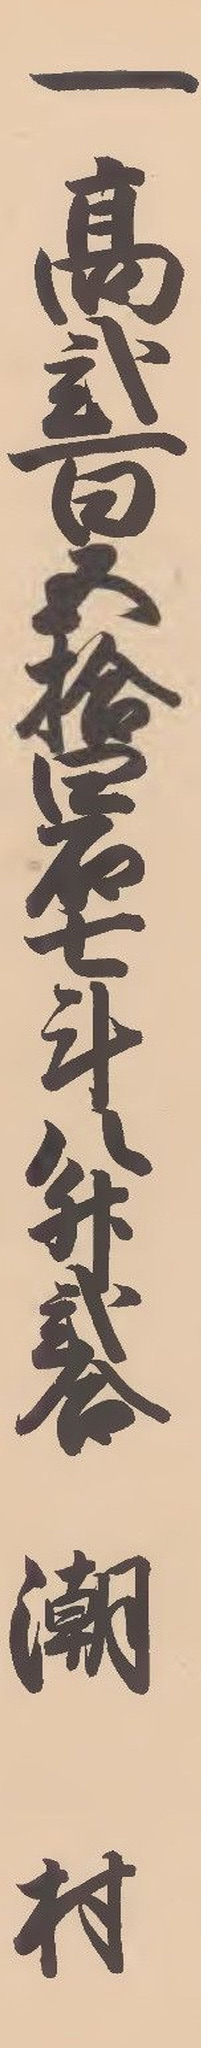一高弐百五拾四石七斗八升弐合潮村
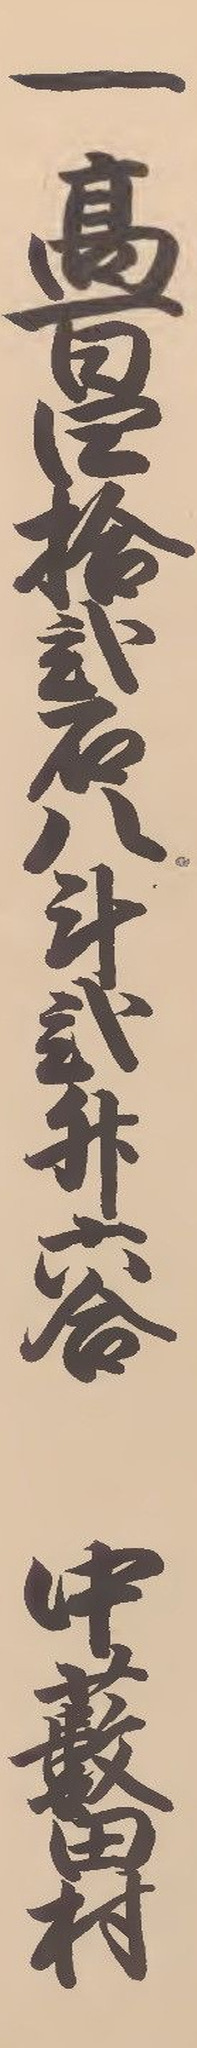一高百四拾弐石八斗弐升六合中薮田村
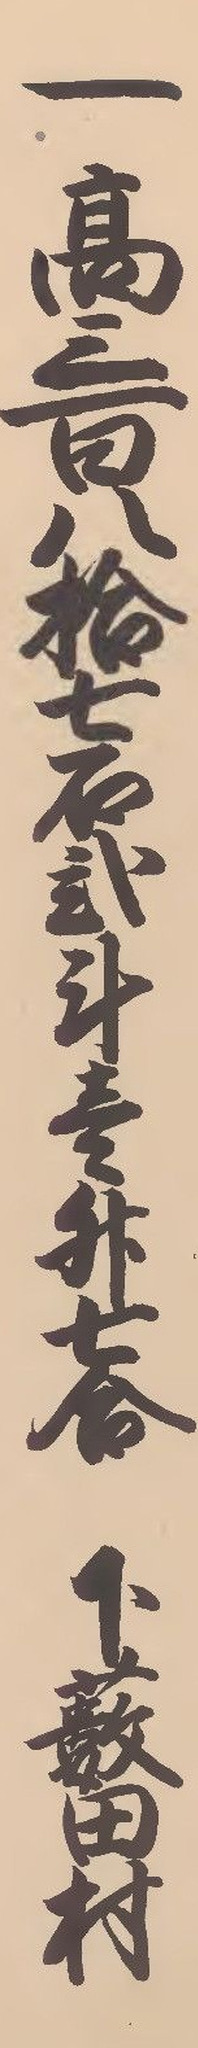一高三百八拾七石弐斗壱升七合下薮田村
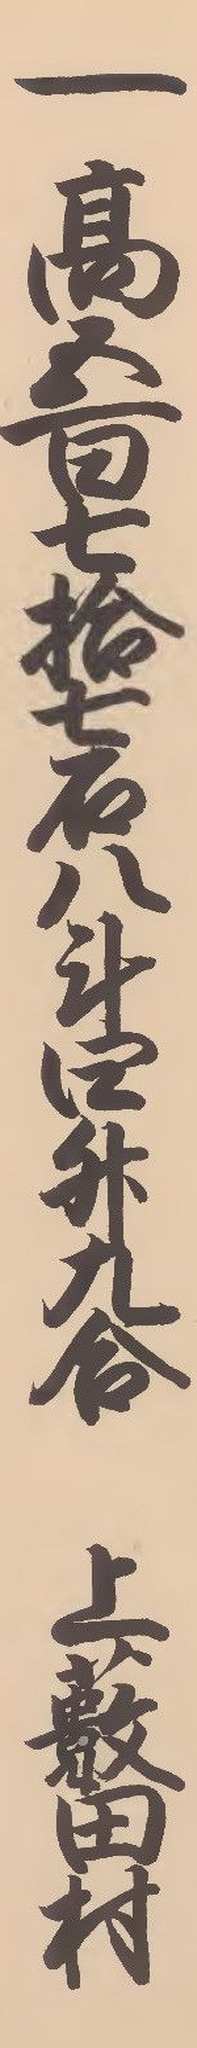一高五百七拾七石八斗四升九合上薮田村
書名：駿河国郷帳
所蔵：国立公文書館 National Archives of Japan
